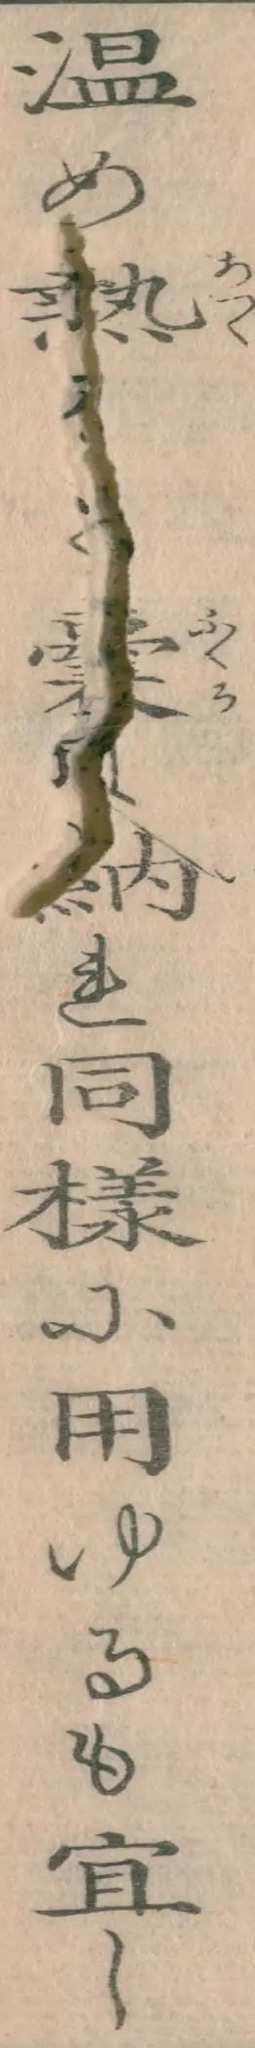温め熱▢▢嚢に納れ同様に用ゆるも宜し
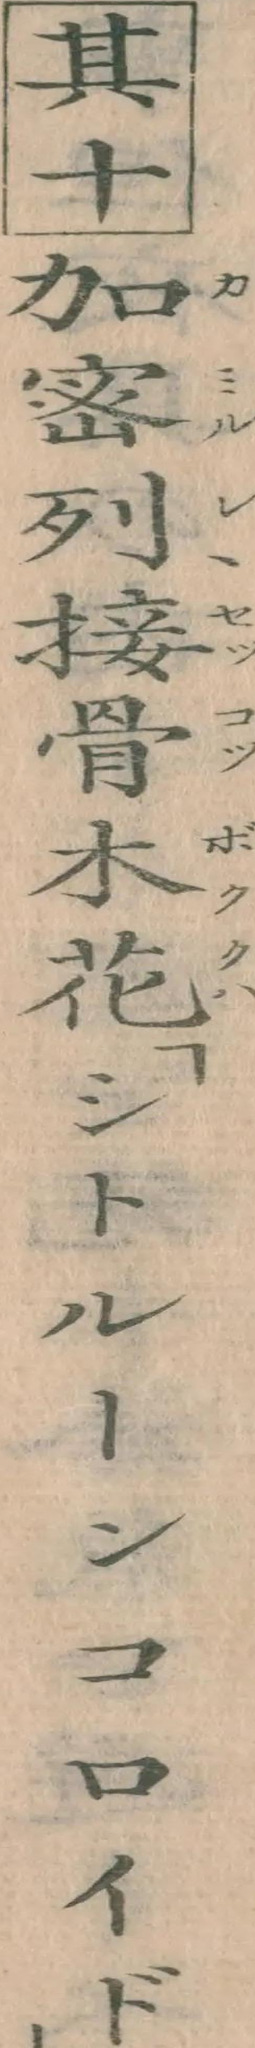其十加密列、接骨木花「シトルーンコロイド」
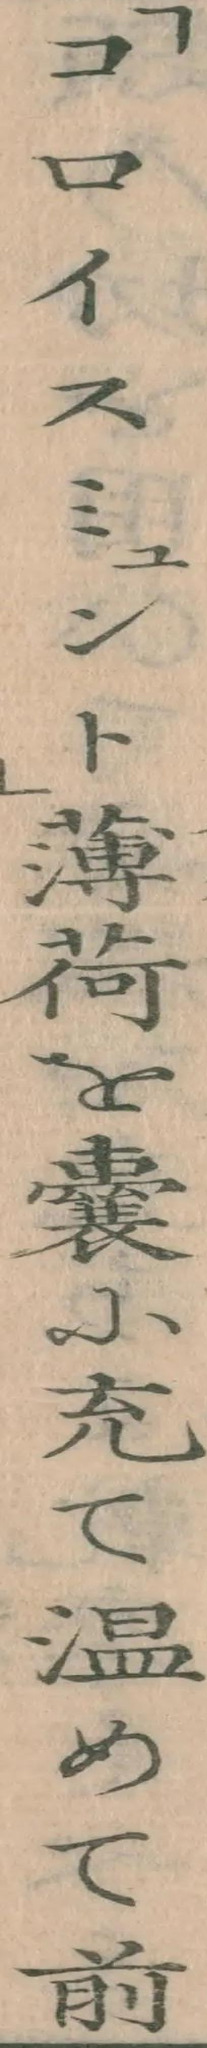「コロイスミュント」薄荷を嚢に充て温めて前
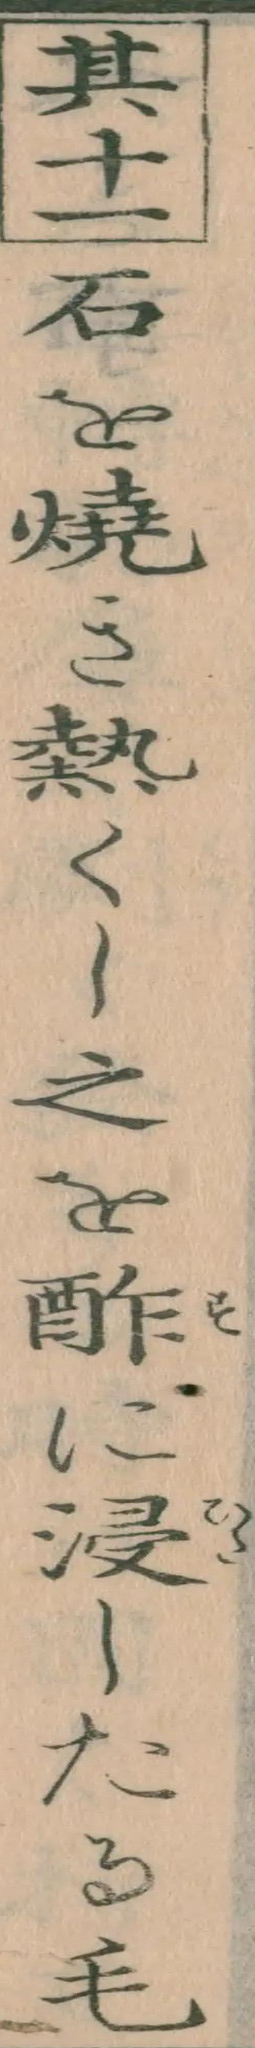其十一石を焼き熱くし之を酢に浸したる毛
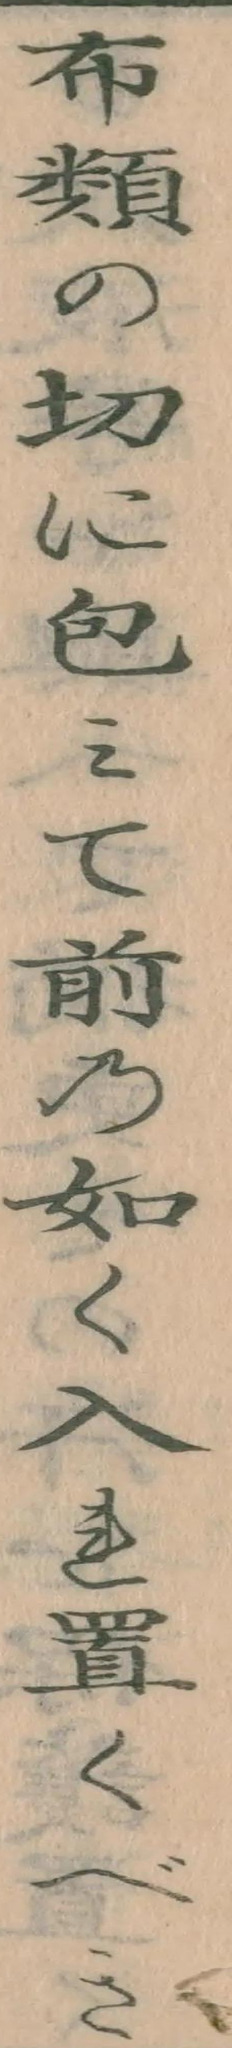布類の切に包みて前の如く入れ置くべき
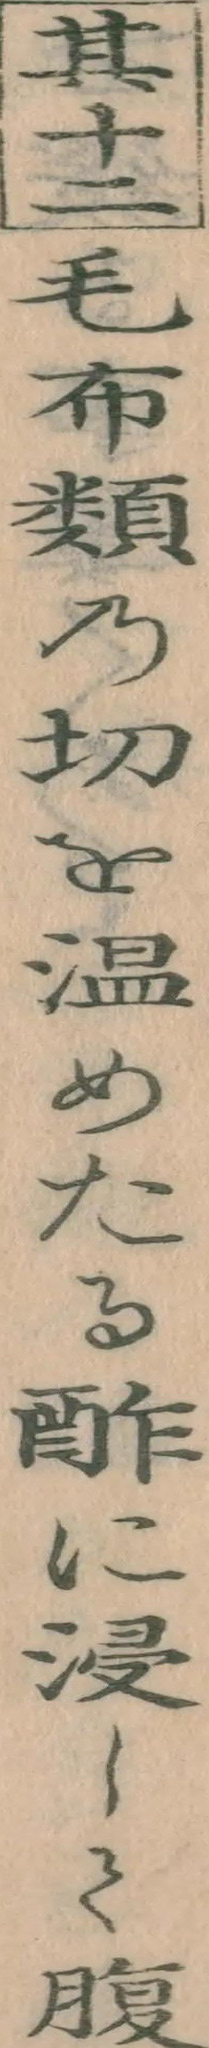其十二毛布類の切を温めたる酢に浸して腹
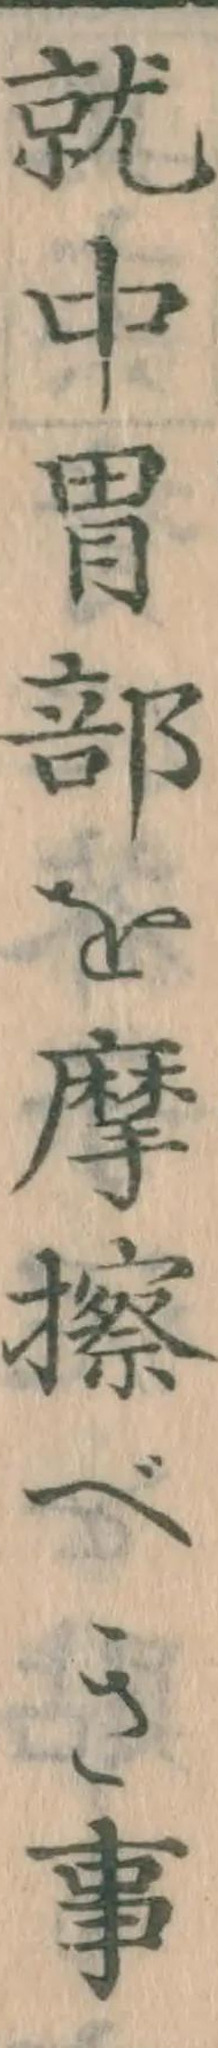就中胃部を摩擦べき事
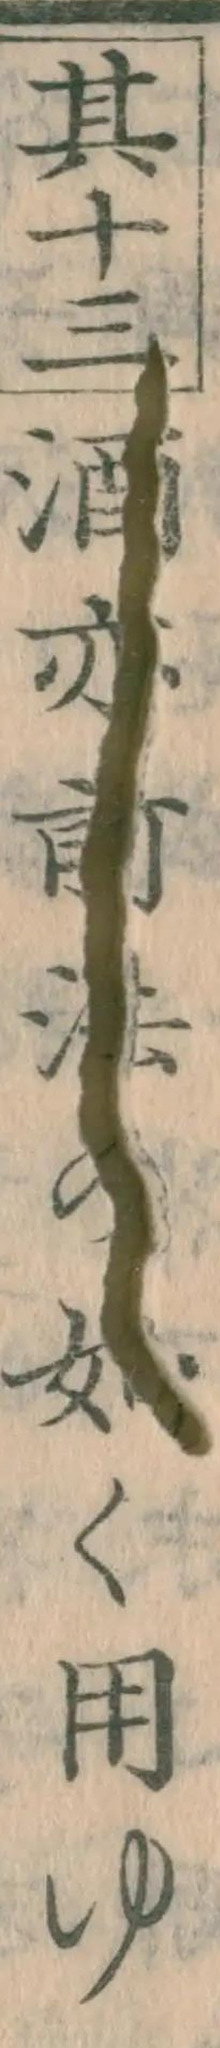其十三酒亦前法の如く用ゆ

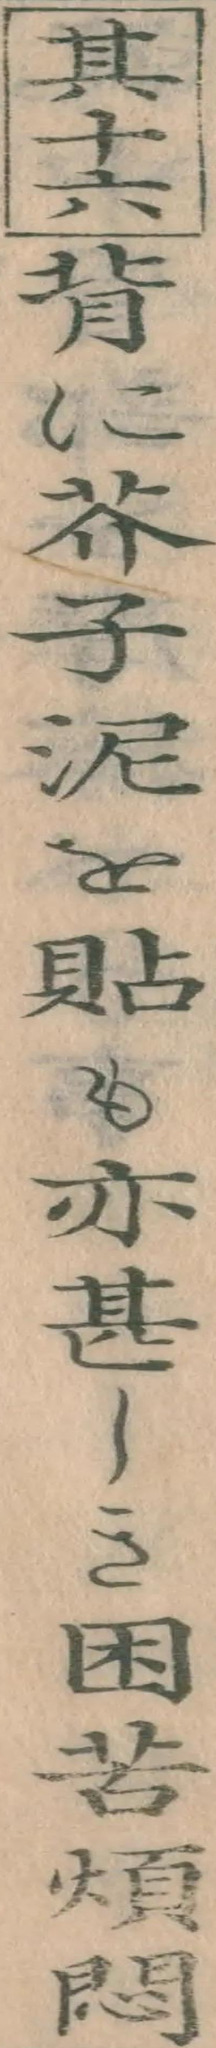其十六背に芥子泥を貼も亦甚しき困苦煩悶
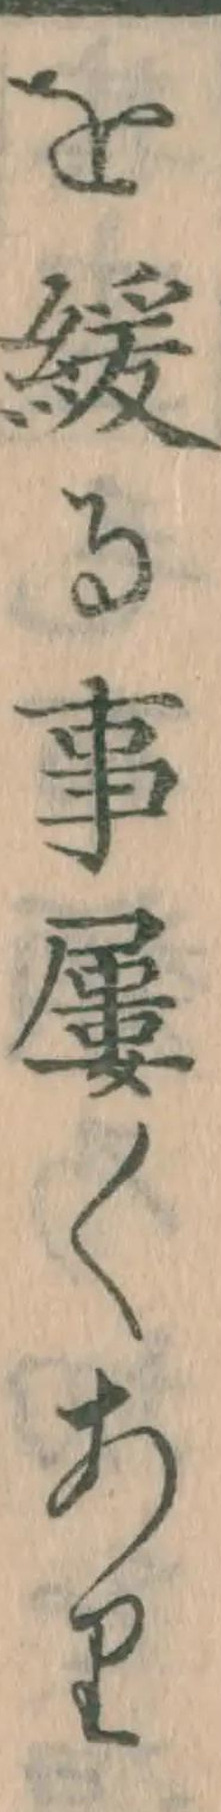を緩る事屢々あり
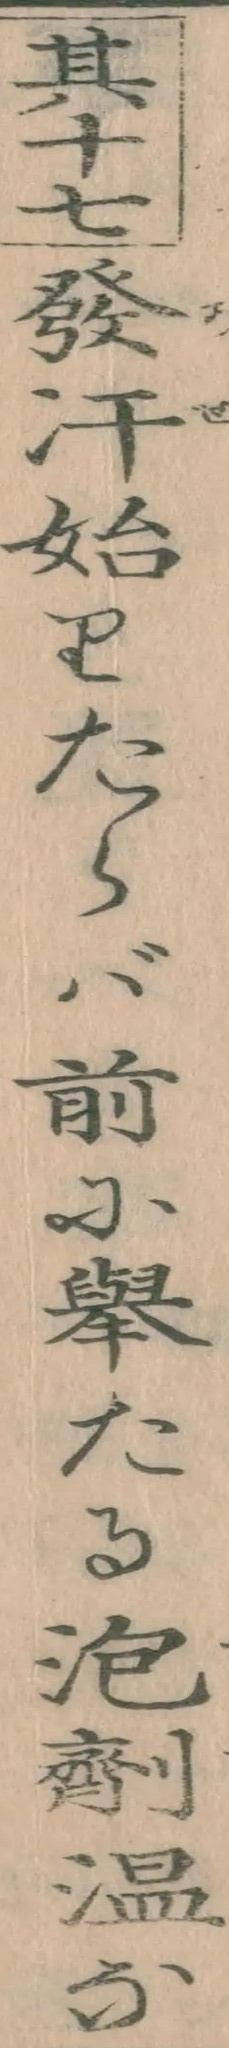其十七発汗始りたらば前に挙たる泡剤温な
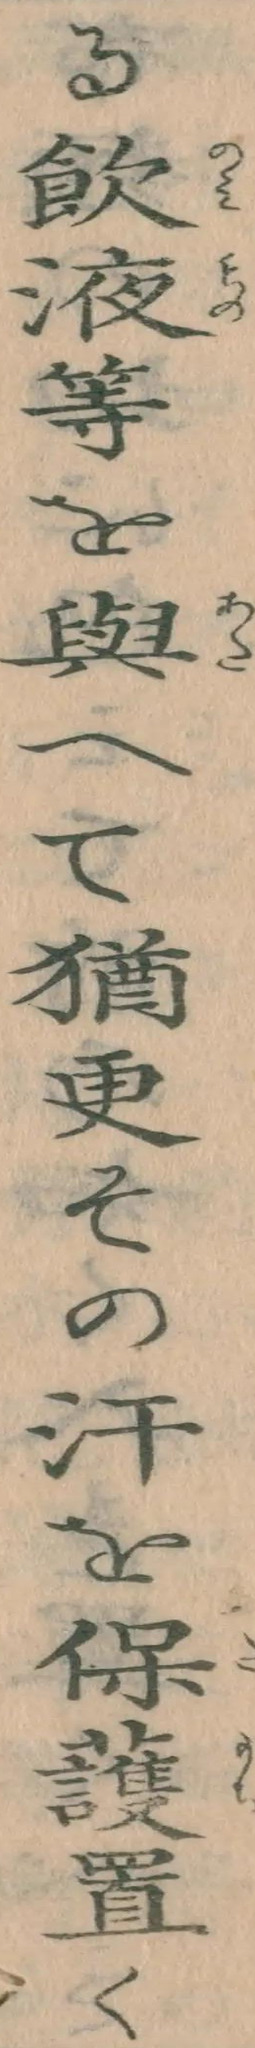る飲液等を与へて猶更その汗を保護置く
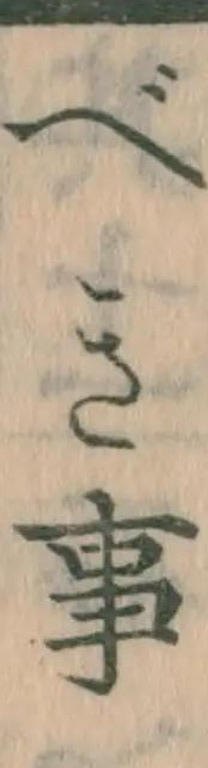べき事
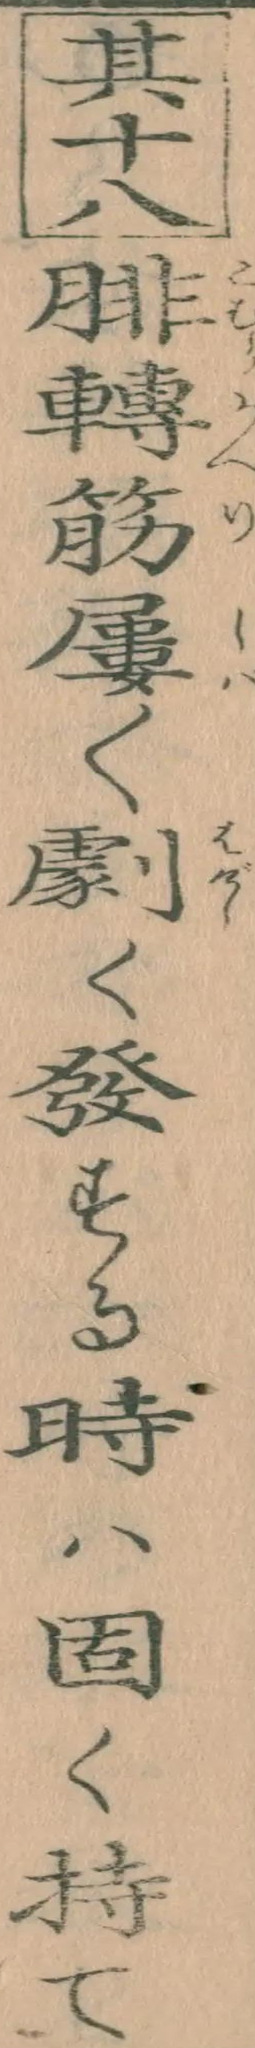其十八腓転筋屢々劇く発する時は固く持て
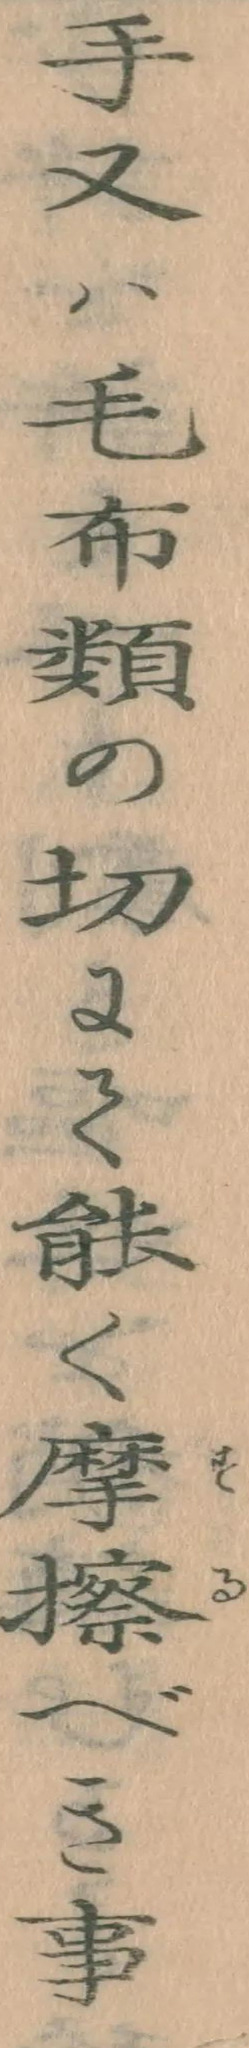手又は毛布類の切にて能く摩擦べき事
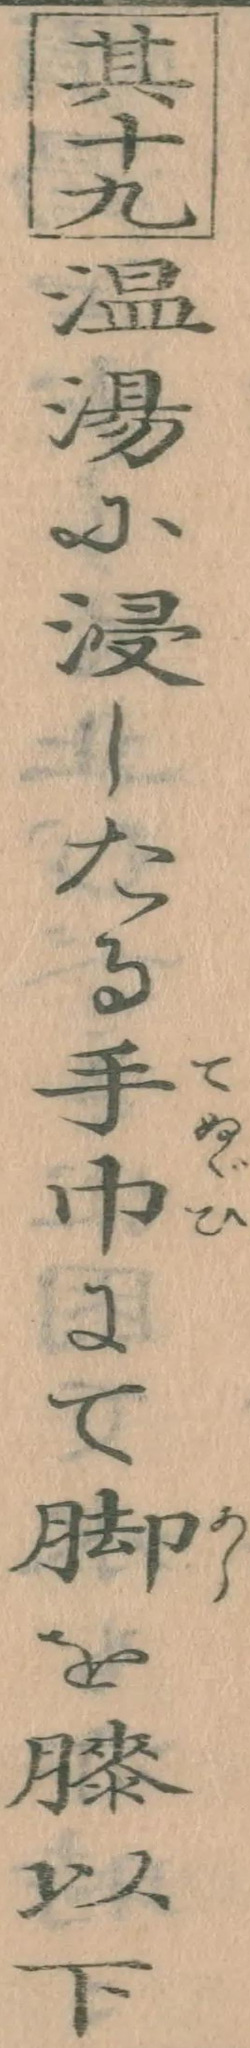其十九温湯に浸したる手巾にて脚を膝以下
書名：暴瀉病手当素人心得書
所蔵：国立国会図書館 National Diet Library, JAPAN
